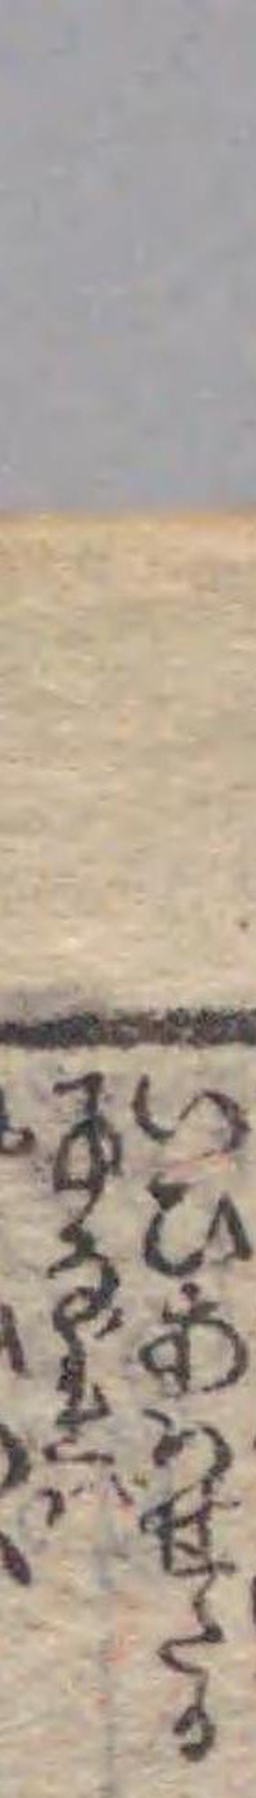事なれば
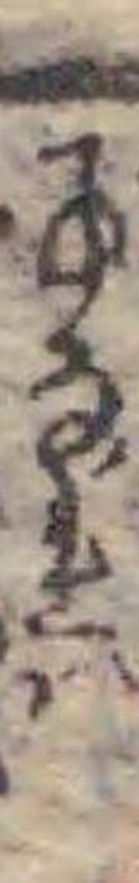事なれば
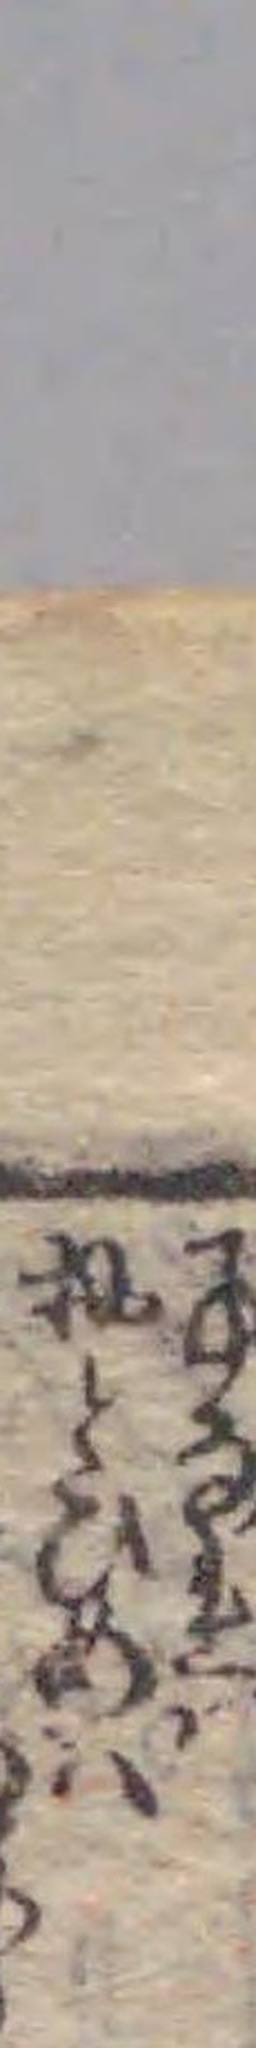おとひめは
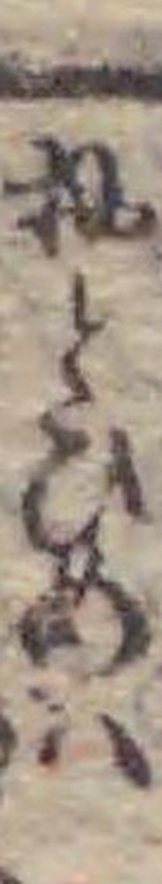おとひめは
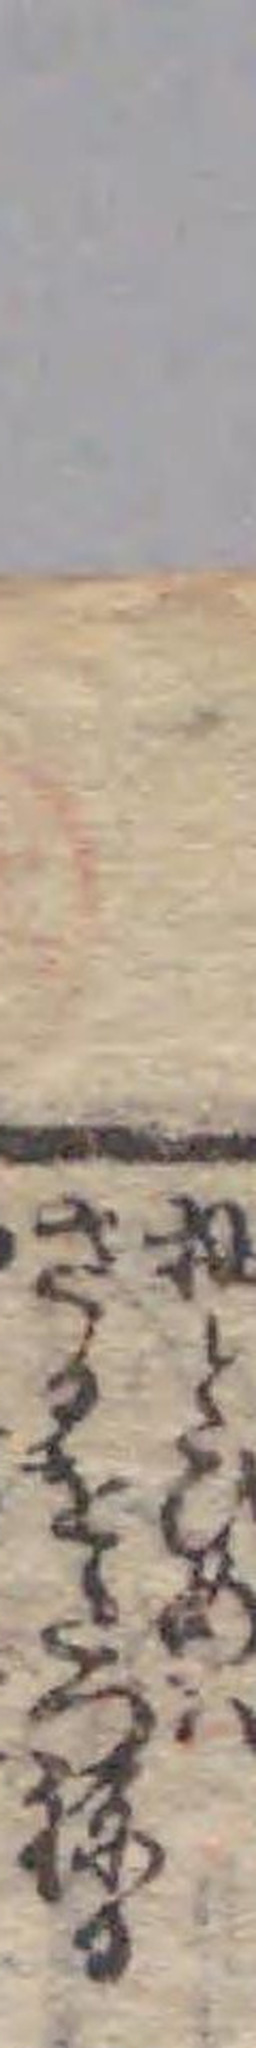さるをたつねる
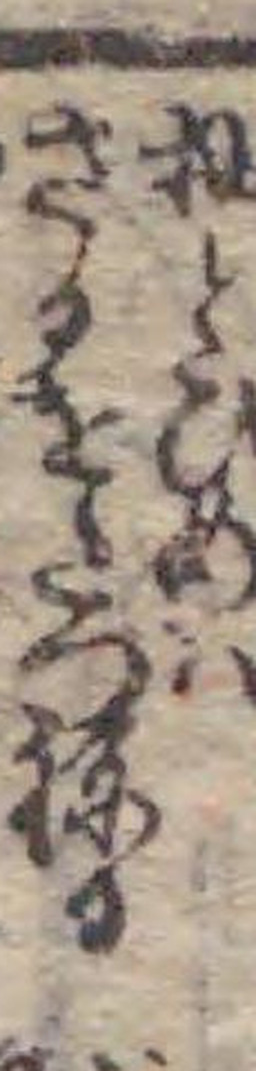さるをたつねる
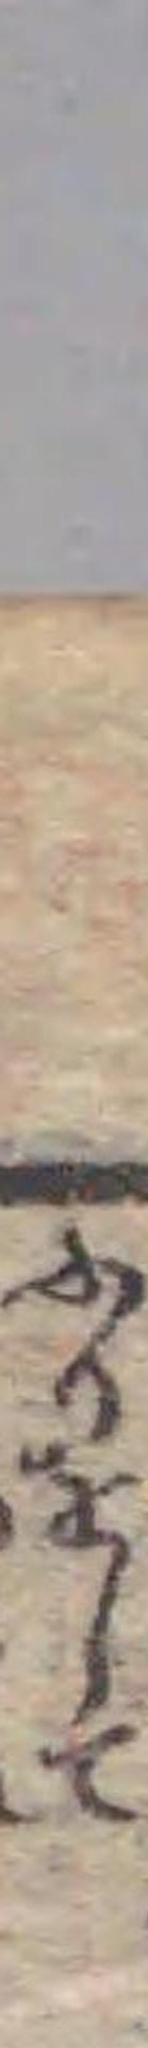ふりをして
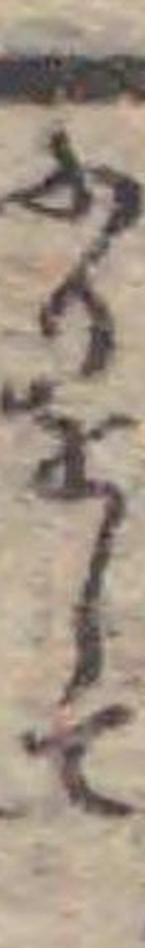ふりをして
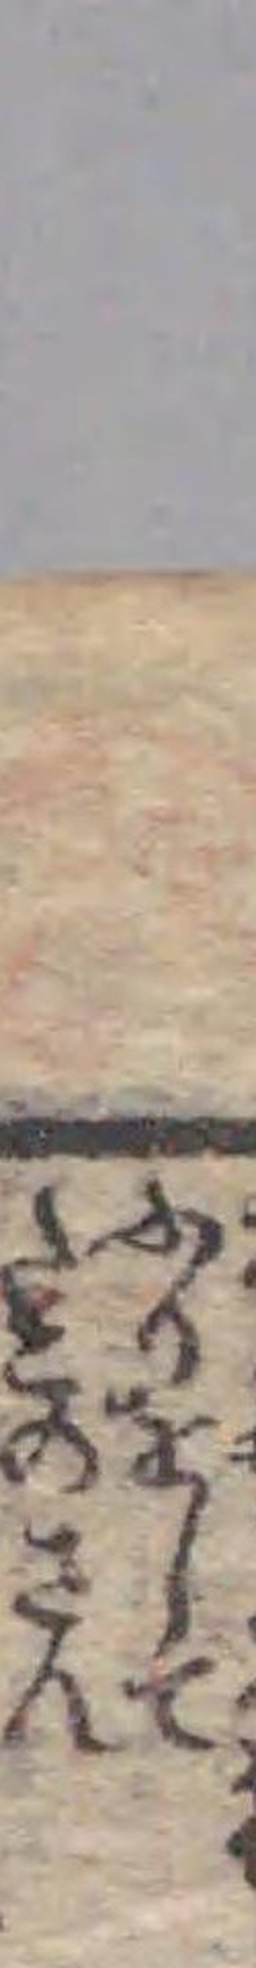たこのさん
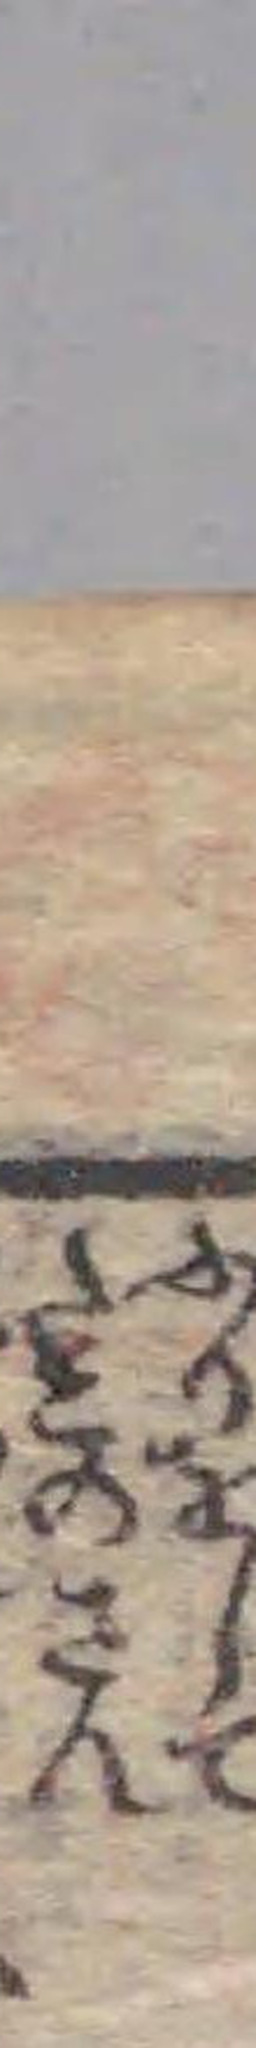たこのさん
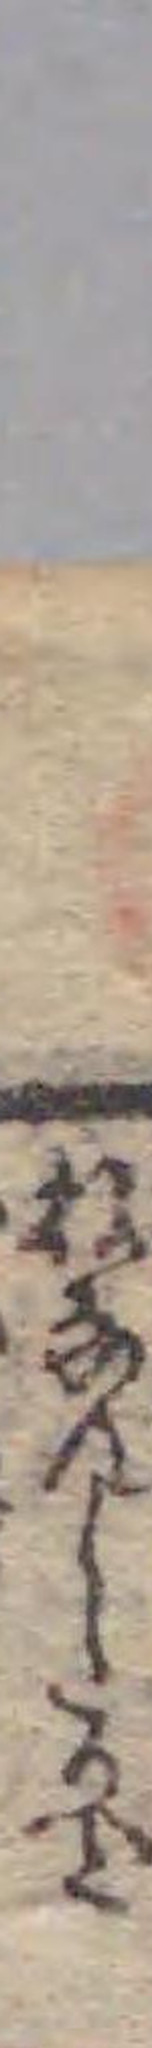ねなんしたかへと
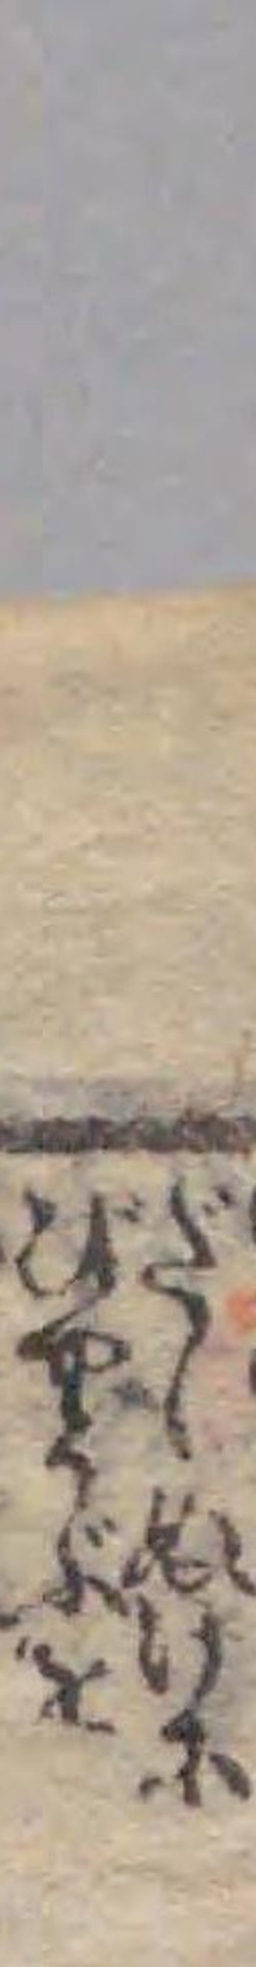びやうぶを
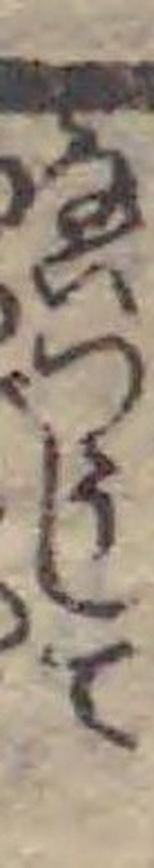ないつうして
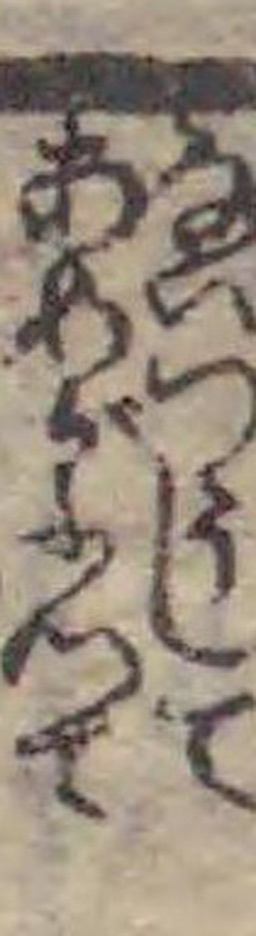あめがふつて
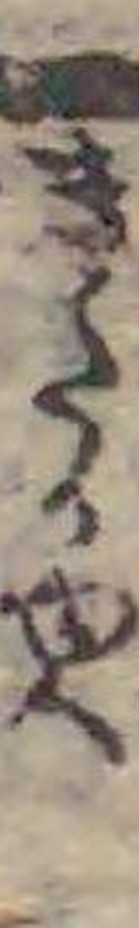きたかゆへ
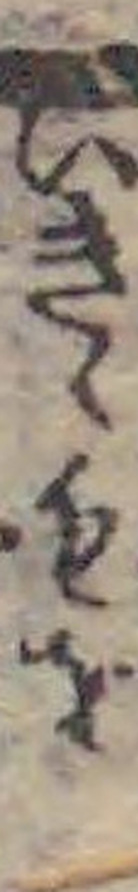いきゝもを
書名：竜宮苦界玉手箱 : 3巻
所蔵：国立国会図書館 National Diet Library, JAPAN
